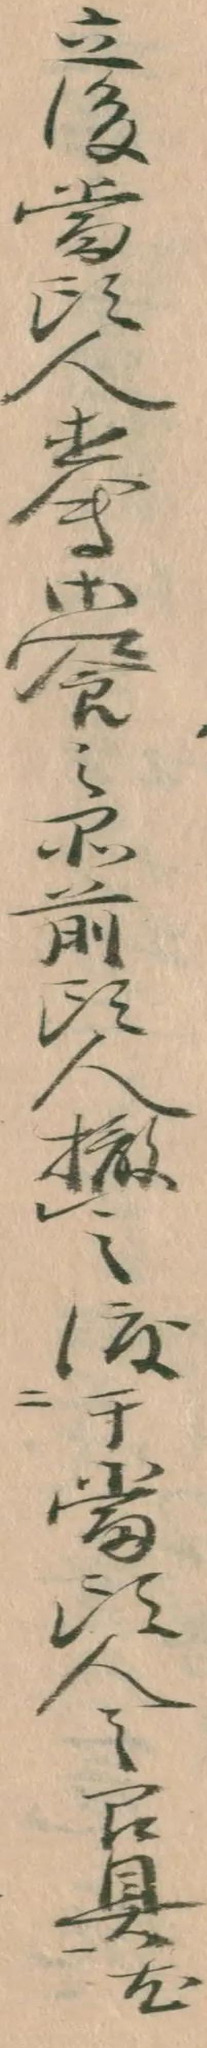立後當頭人直會御饗之品前頭人撒之渡于當頭人之召具尤
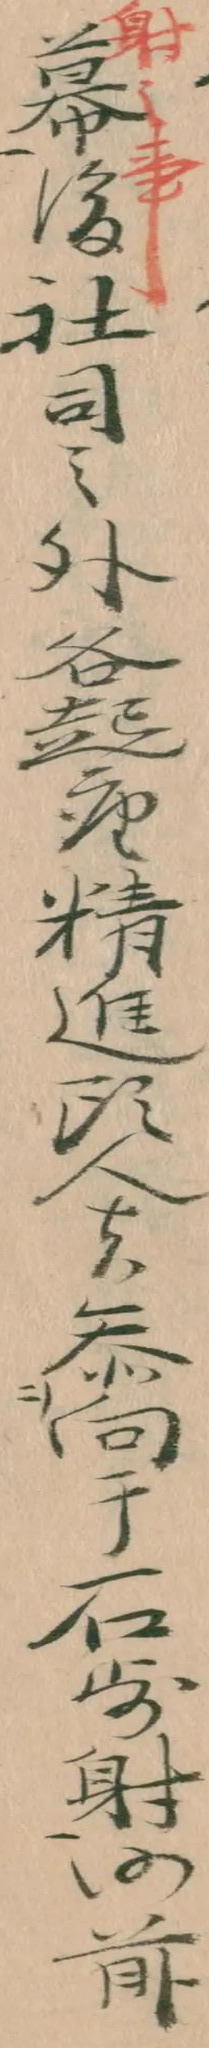幕後社司之外各起座精進頭人は参向于石歩射仍前
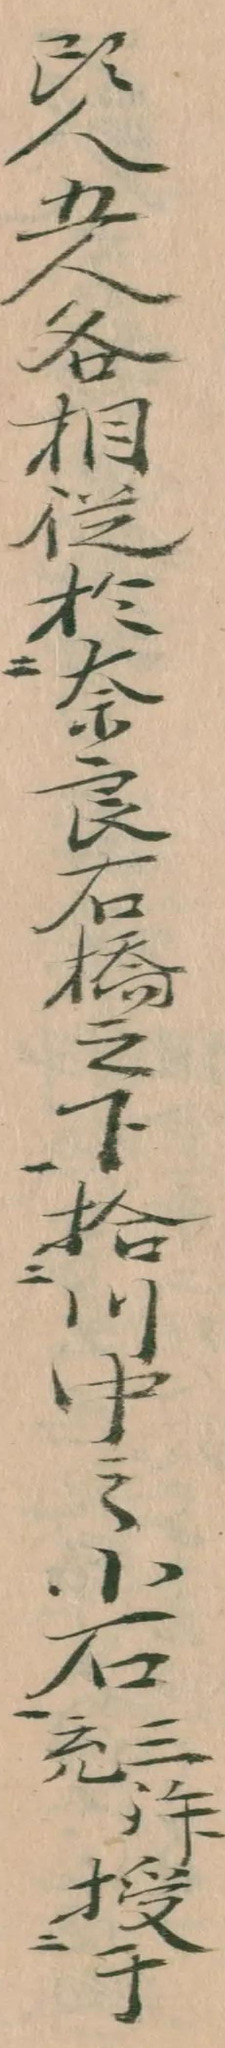頭人五人各相従於奈良石橋之下拾川中之小石三許充授于
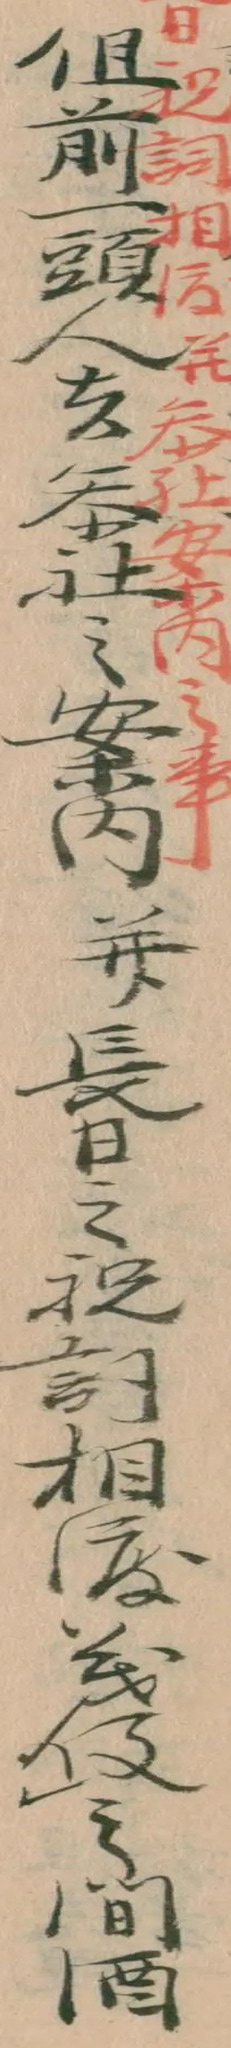但前一頭人者参社之案内并長日之祝詞相渡義役之間酒
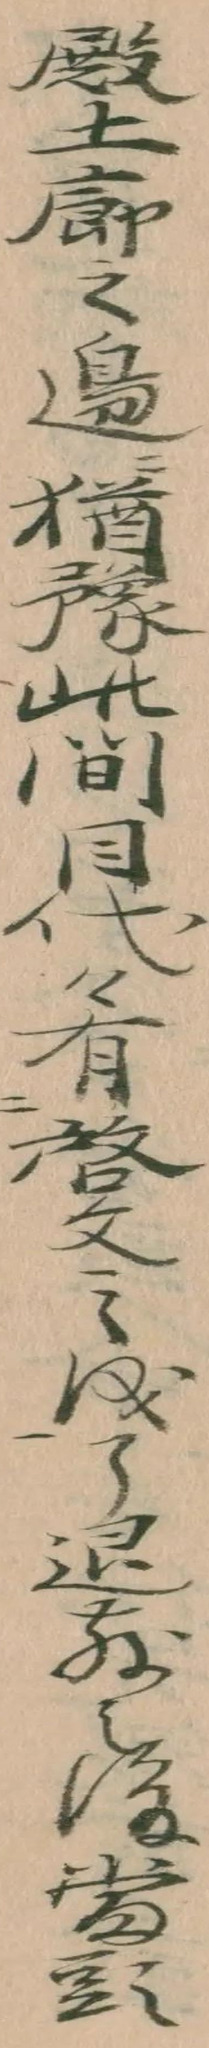殿土廊之邊ニ猶豫此間目代々有啓文之儀了退散之後當頭
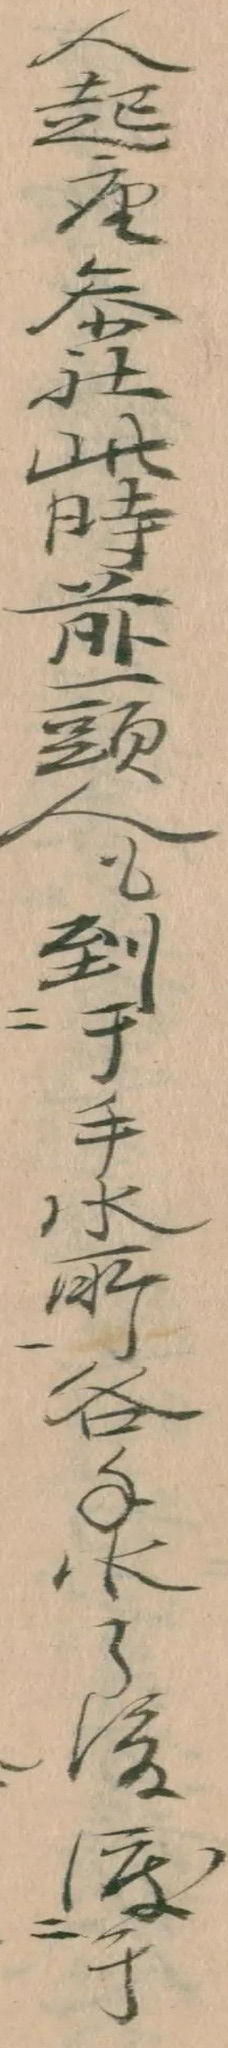人起座参社此時前一頭人も到于手水所各手水之後渡于
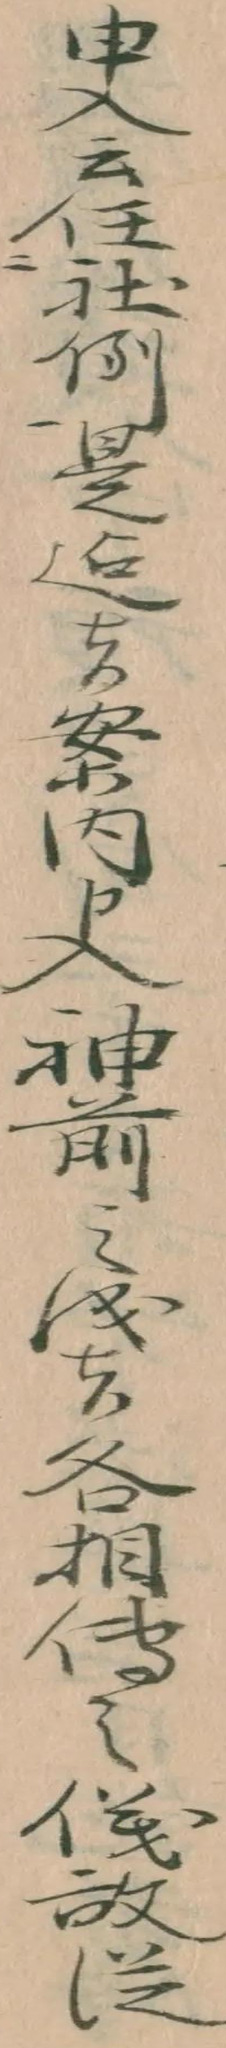申入云任社例是迄は案内申入神前之儀は各相傳之儀故従
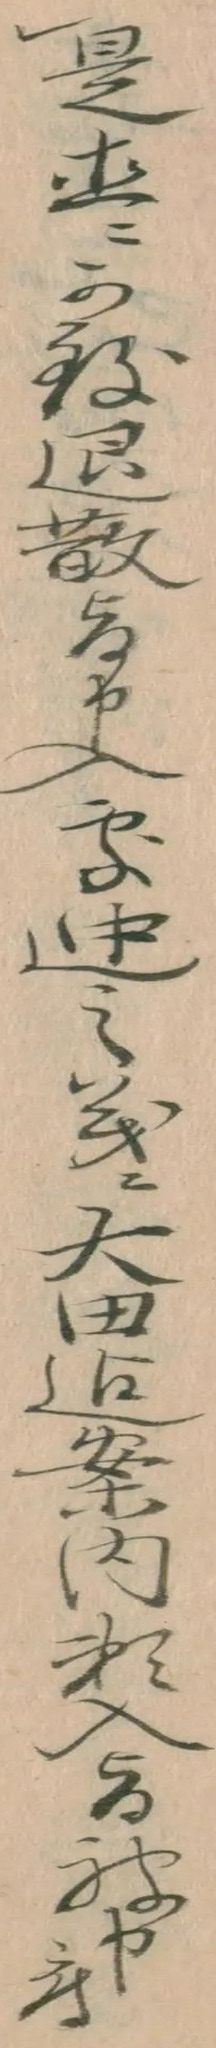是直ニ可致退散旨申入處迚之義ニ大田迄案内頼入旨被申ニ付
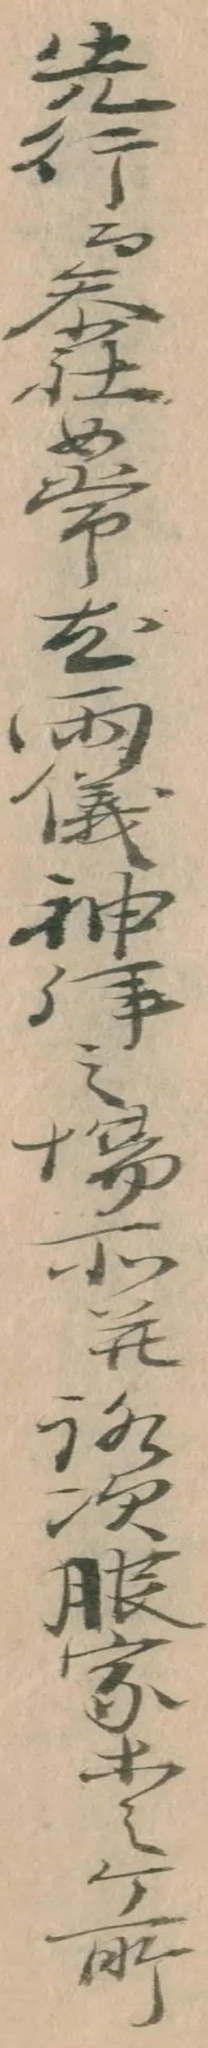先行而参社如常尤両儀神拝之場所并路次服家等之ケ所
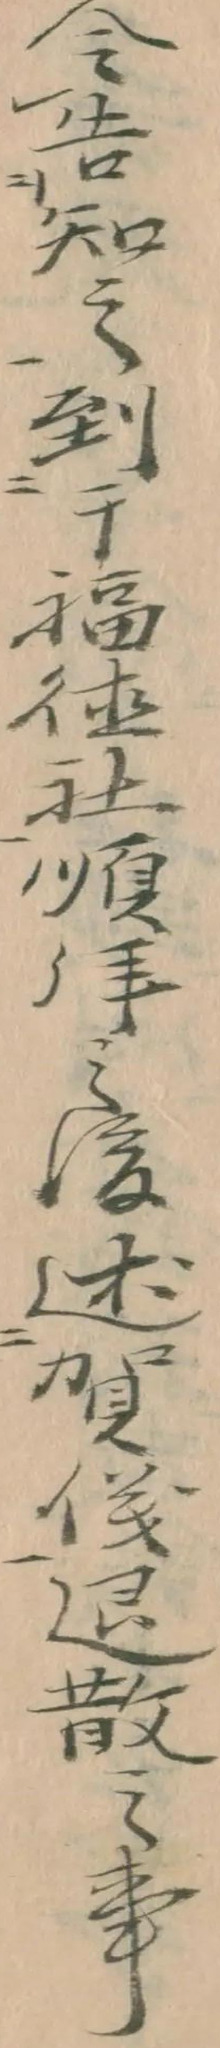令レ告知之到二于福徳社順拝之後述賀儀退散之事

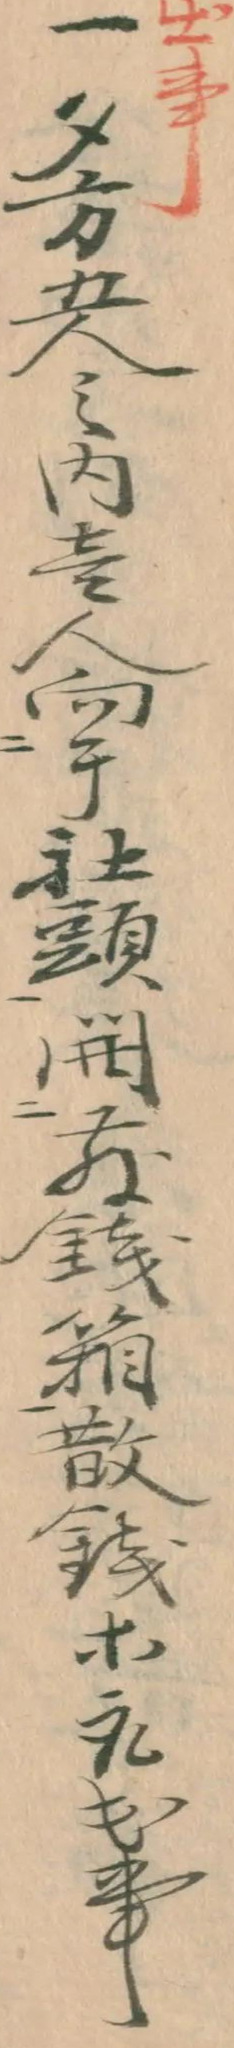一夕方五人之内壱人向于社頭開敷銭箱散銭等取出事
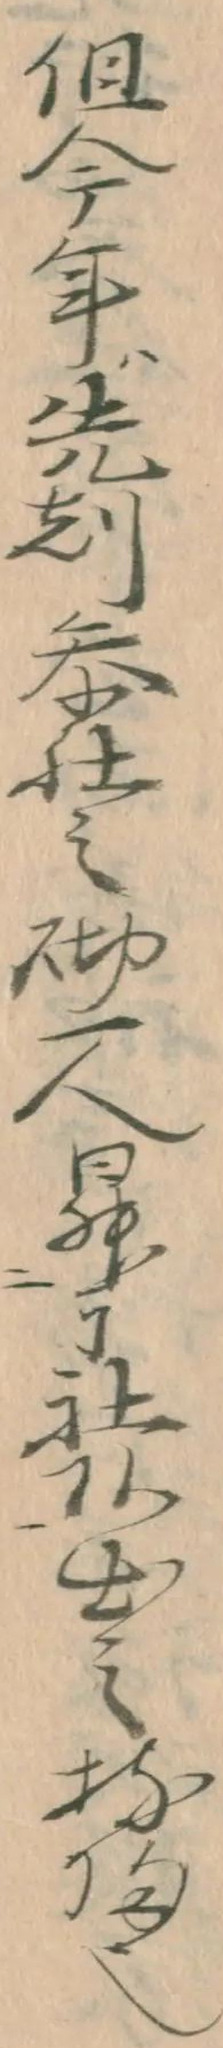但今年ハ先刻参社之砌一人昇于社頭出之持帰也
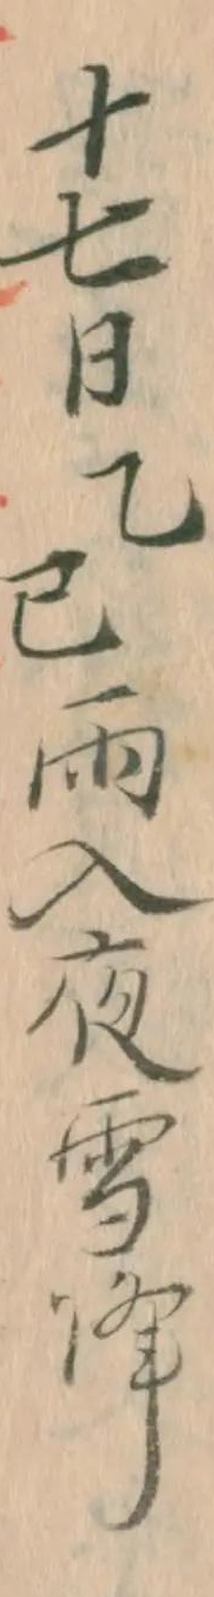十七日乙巳雨入夜雪降
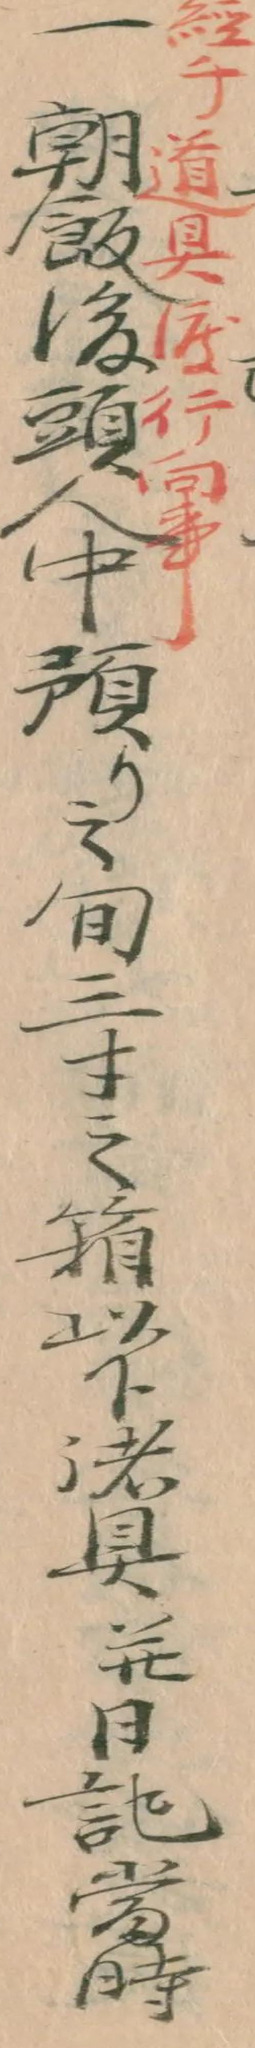一朝飯後頭人中預り之旬三寸之箱以下諸具并日記當時
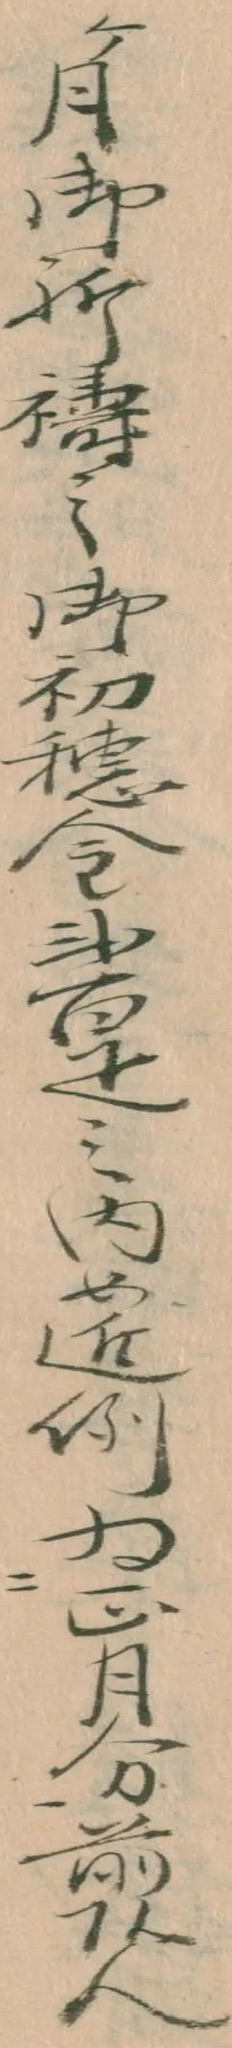ケ月御祈祷之御初穂金弐百疋之内如近例為正月分前頭人
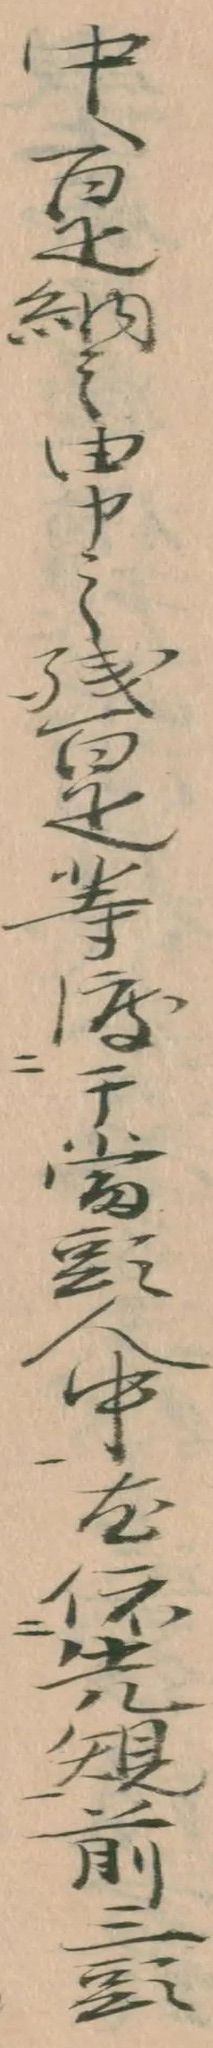中へ百疋納之由申之残百疋等渡于當頭人中尤依先規前三司
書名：賀茂社記録. 第74冊
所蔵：国立国会図書館 National Diet Library, JAPAN
